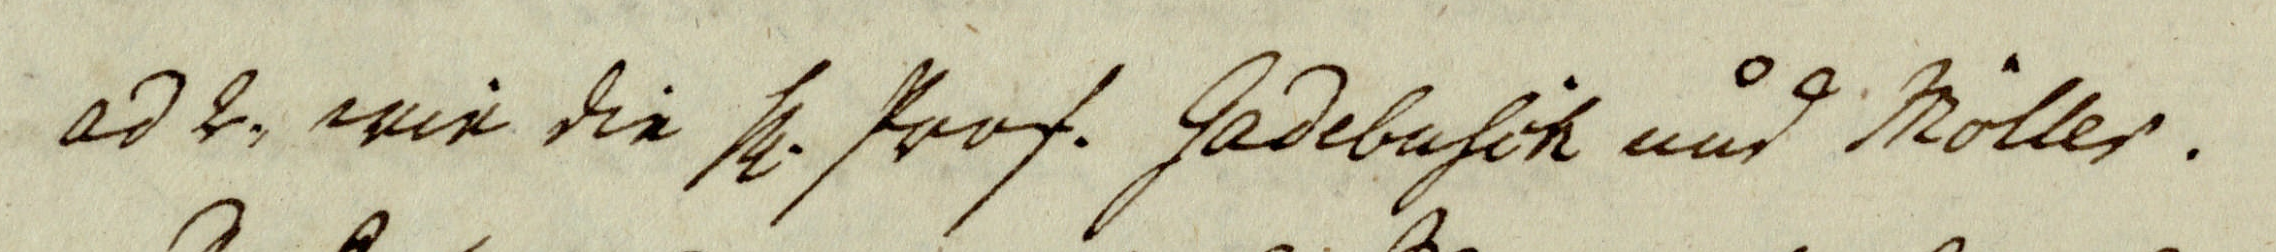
ad 2. wie die dh. Prof. Gadebusch und Möller.
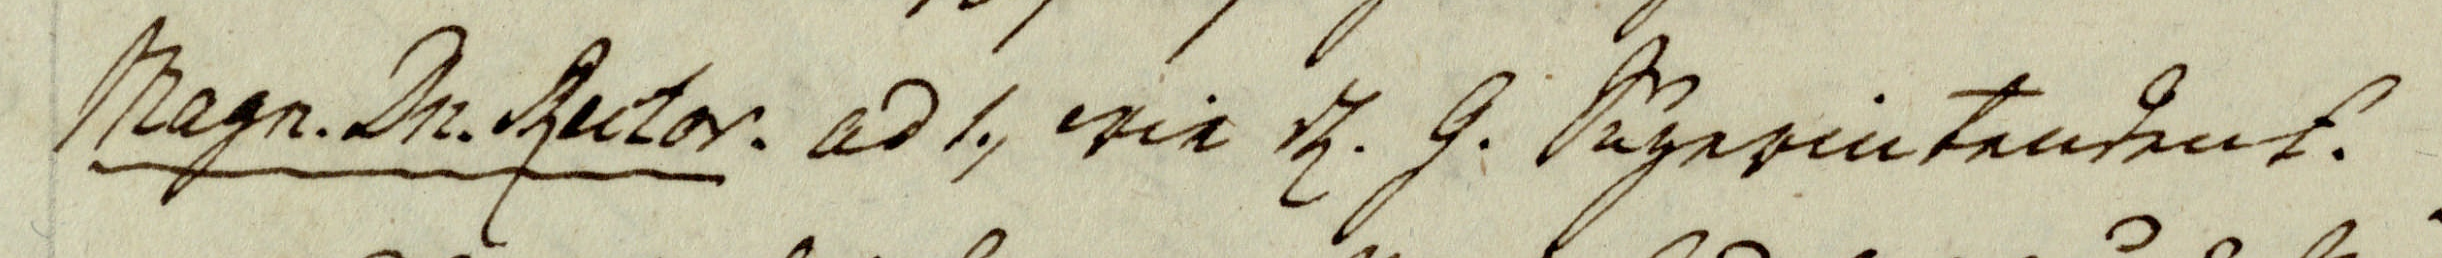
Magn. Dn. Rector. ad 1., wie dh. G. Superintendent.
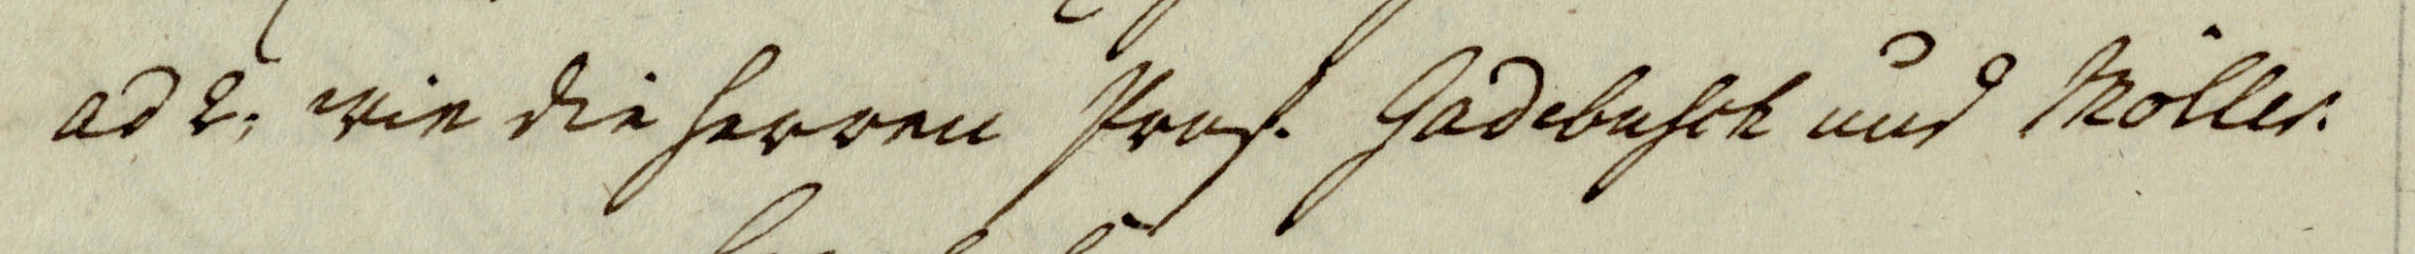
ad 2. wie die Herren Prof. Gadebusch und Möller.
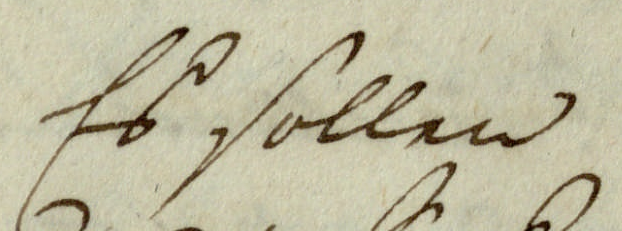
Es sollen
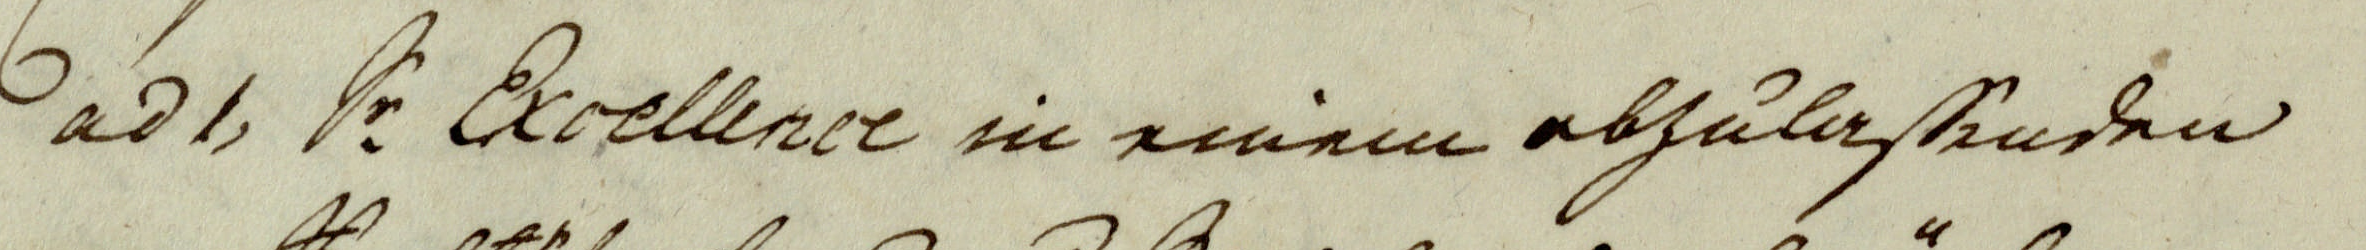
ad 1, Sr Excellence in einem abzulassenden
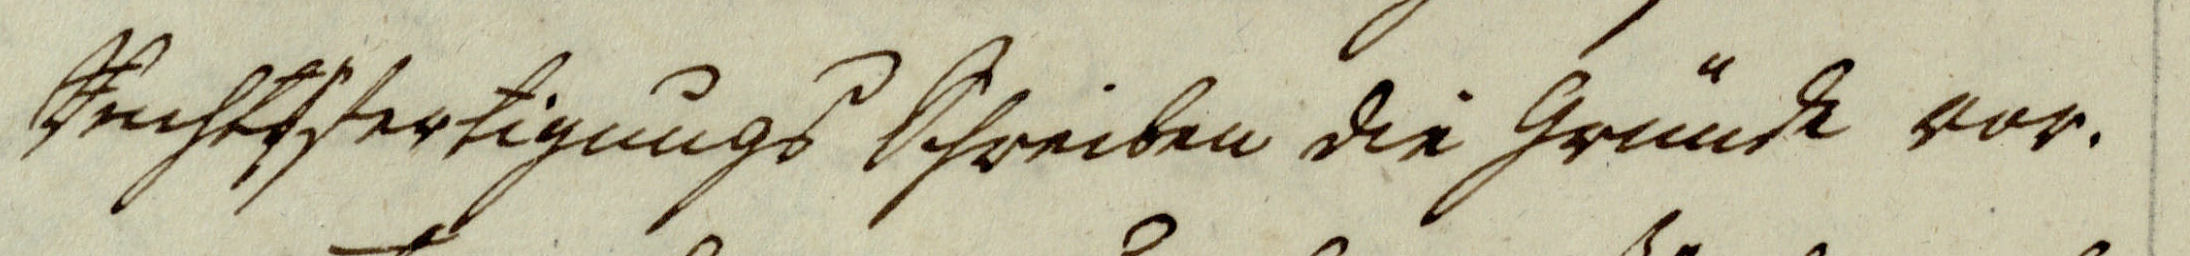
Rechtsfertigungs Schreiben die Gründe vor¬
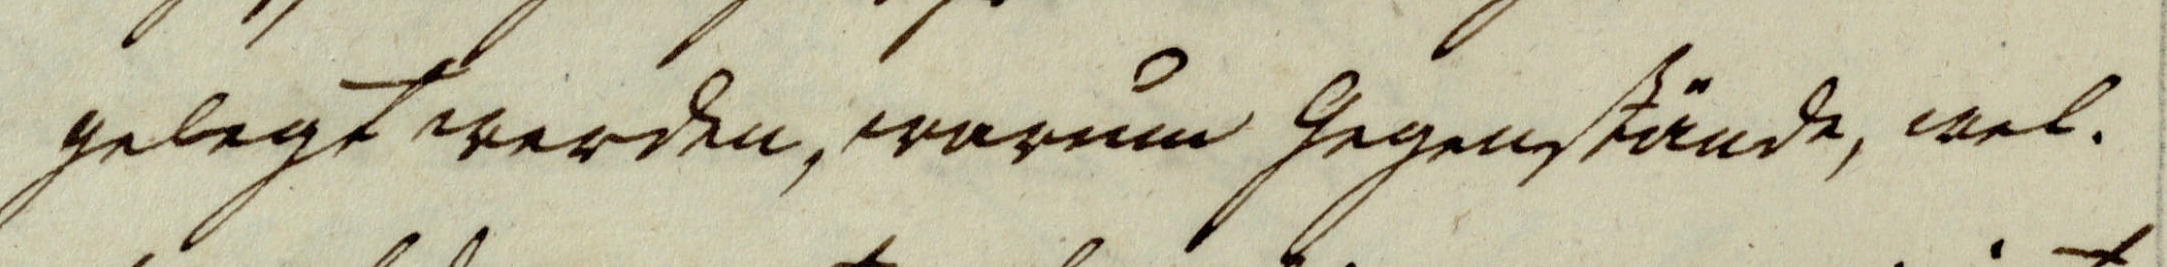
gelegt werden, warum Gegenstände, wel¬
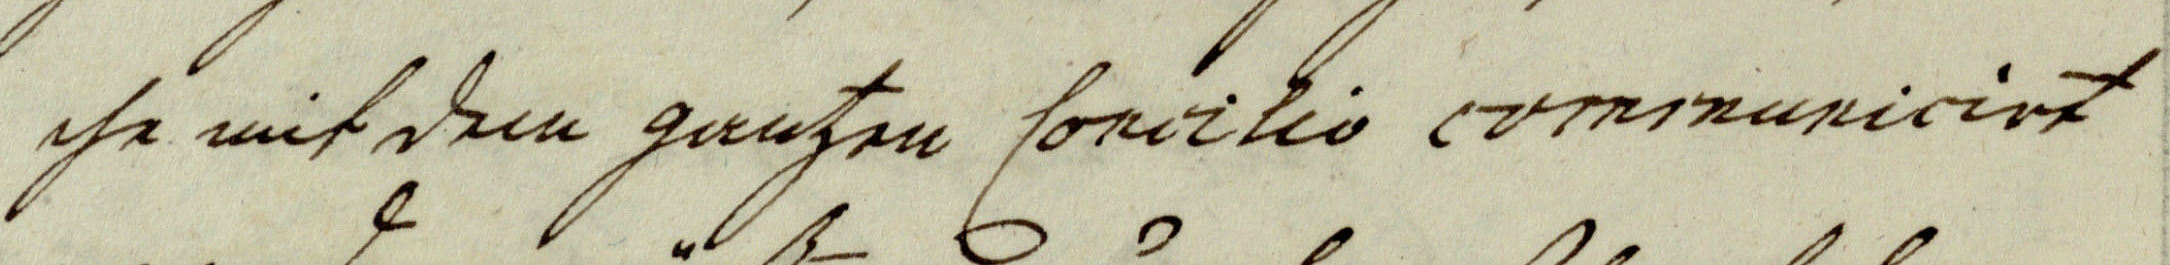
che mit dem gantzen Concilio communicirt
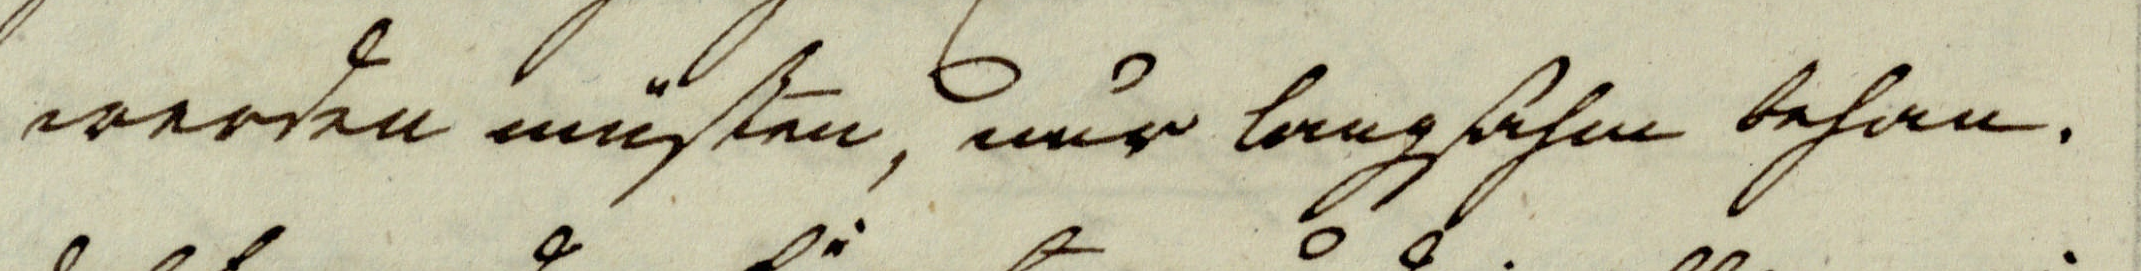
werden müßten, nur langsahm behan¬
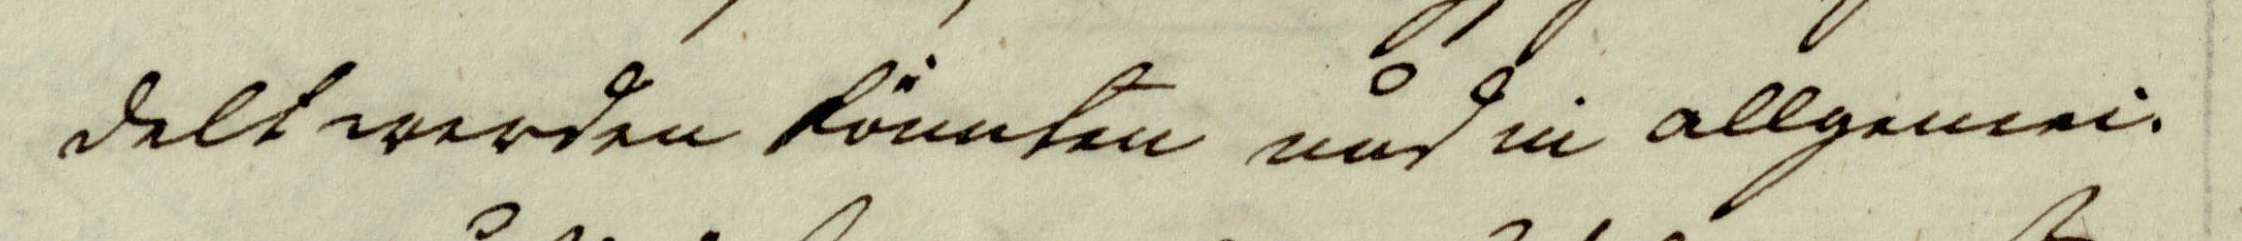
delt werden könnten und in allgemei¬
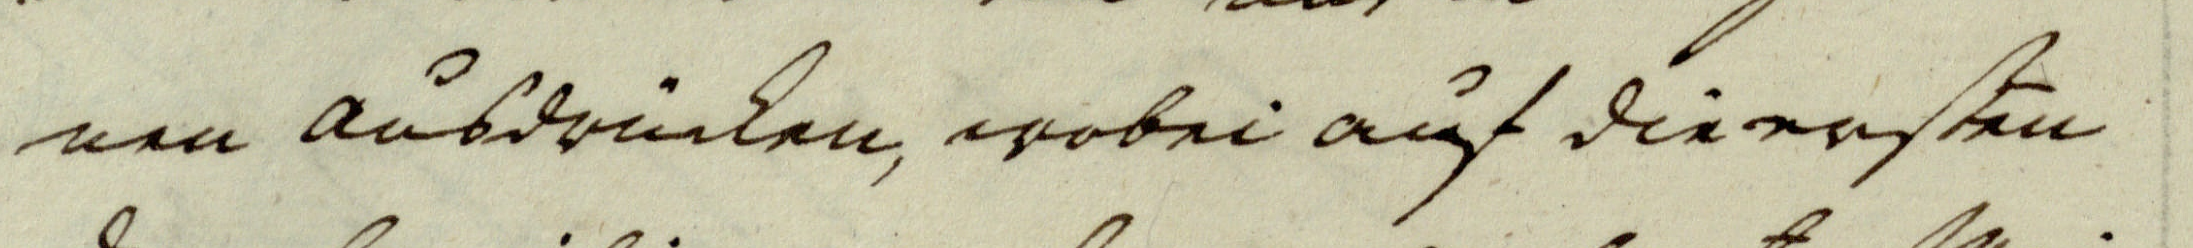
nen Ausdrücken, wobei auf die ersten
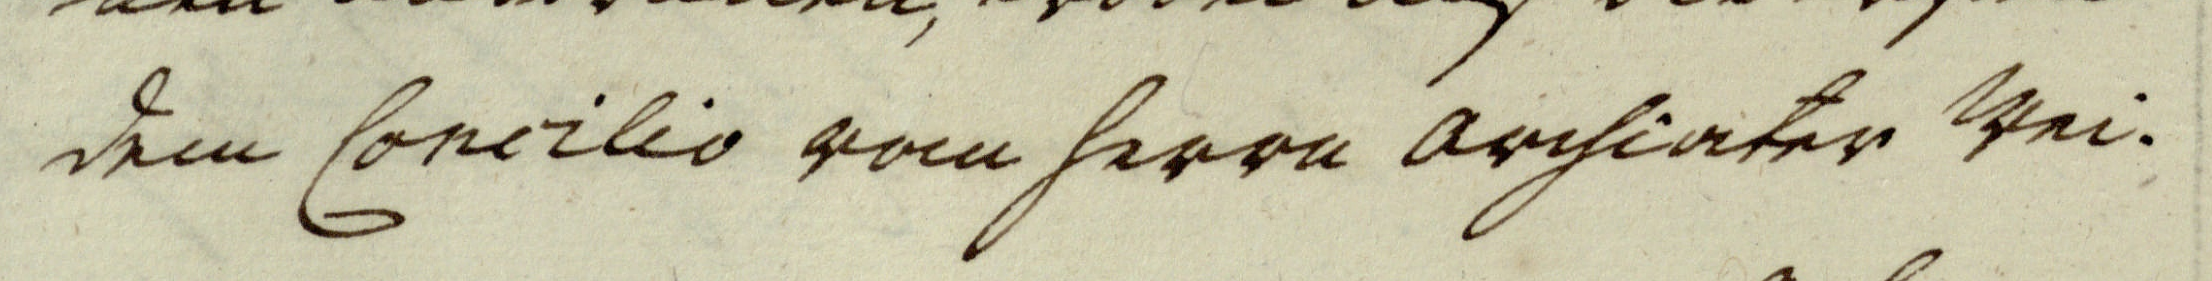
dem Concilio vom Herrn Archiater Wei¬
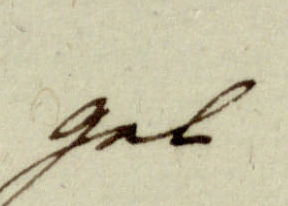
gel
